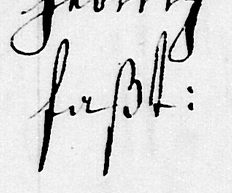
faßt:
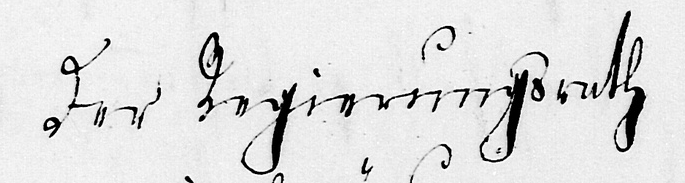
Der Regierungsrath
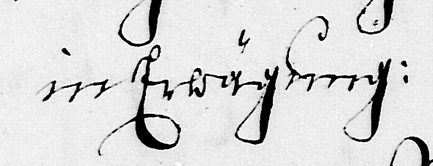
in Erwägung:
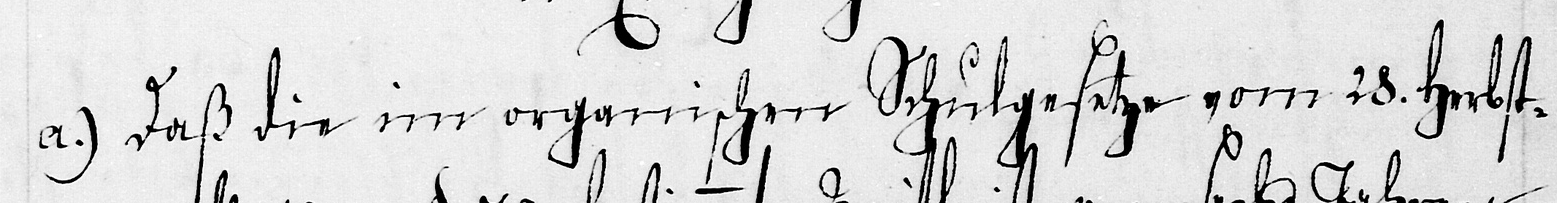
a.) Daß die im organischen Schulgesetze vom 28. Herbst¬
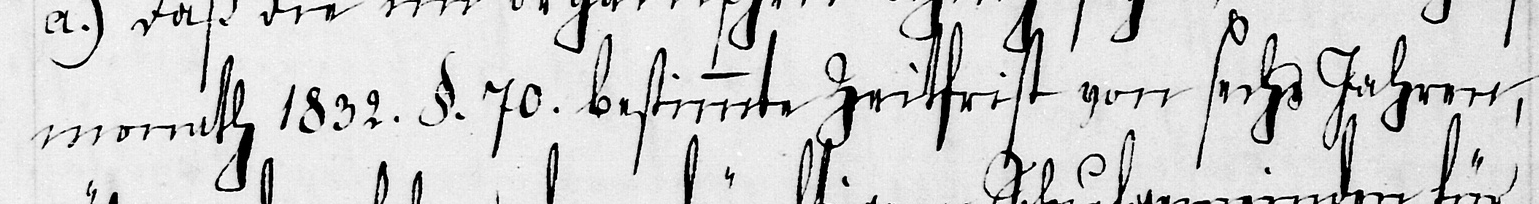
monath 1832. §. 70. bestimmte Zeitfrist von sechs Jahren,
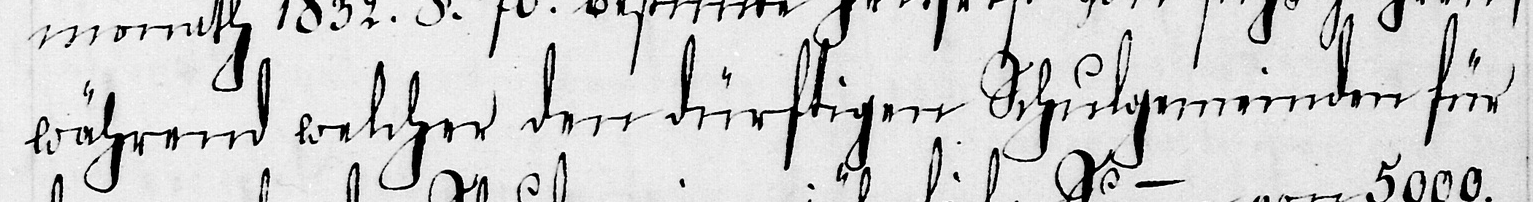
während welcher den dürftigen Schulgemeinden für
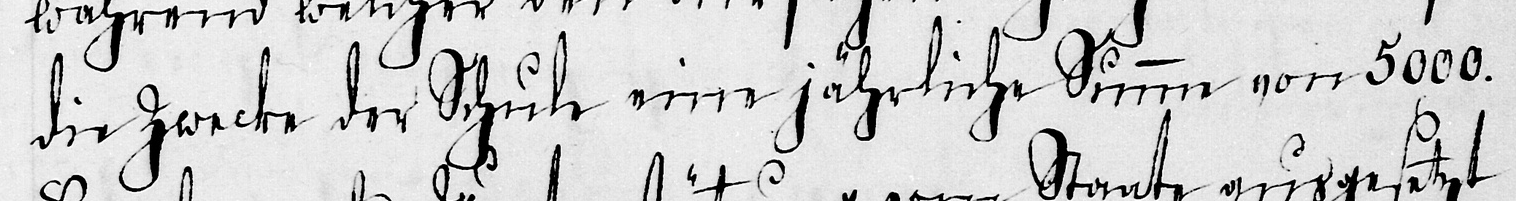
die Zwecke der Schule eine jährliche Summe von 5000.
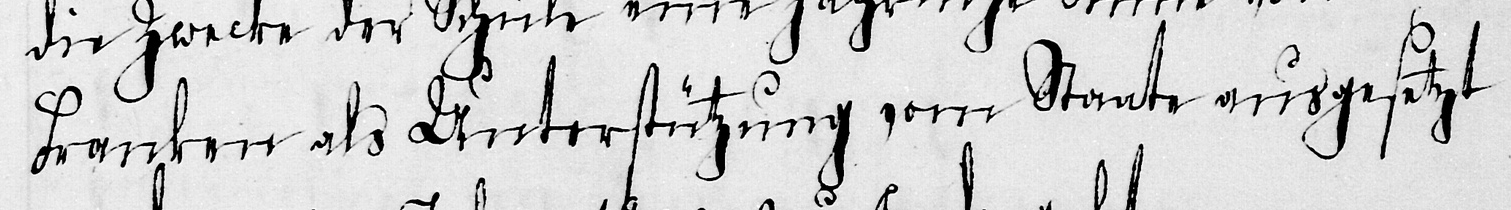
Franken als Unterstützung vom Staate ausgesetzt
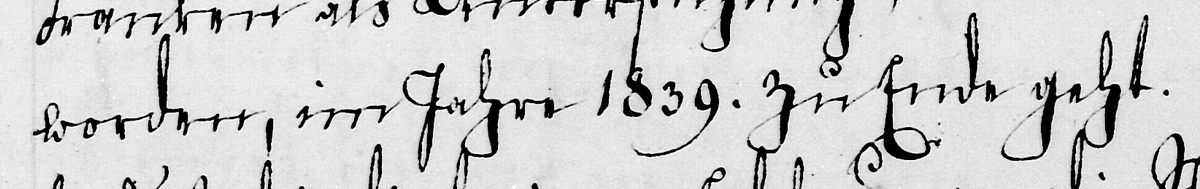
worden, im Jahre 1839. zu Ende geht.
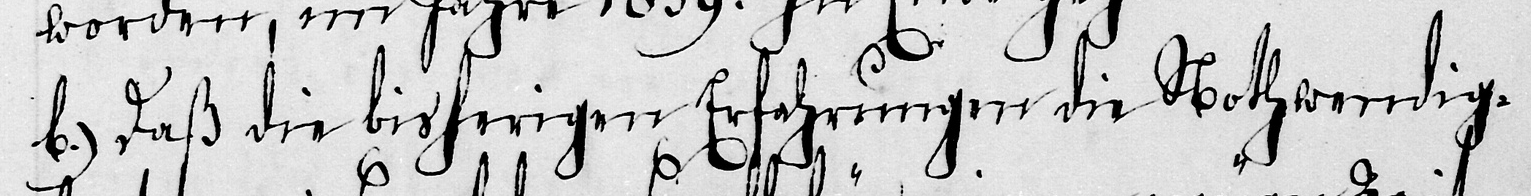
b.) Daß die bisherigen Erfahrungen die Nothwendig¬
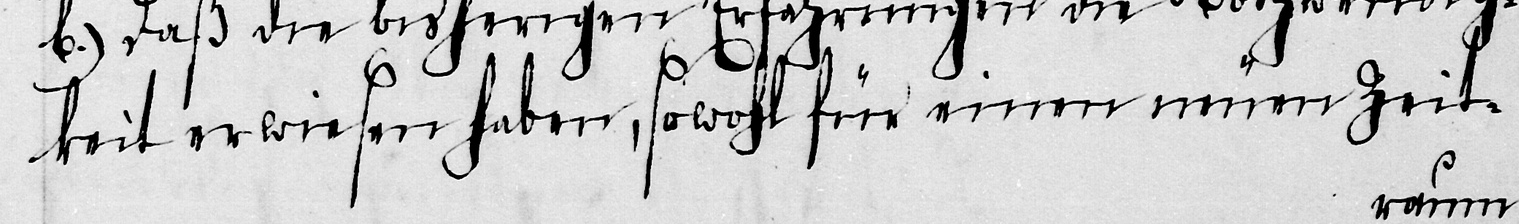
keit erwiesen haben, sowohl für einen neuen Zeit-
